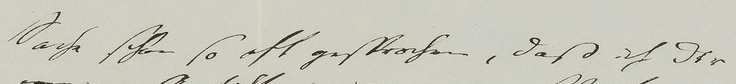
Sache schon so oft gesprochen, daß ich Dir
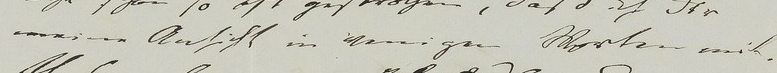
meine Ansicht in wenigen Worten mit-
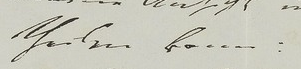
theilen kann:
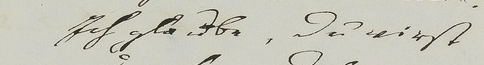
Ich glaube, Du wirst
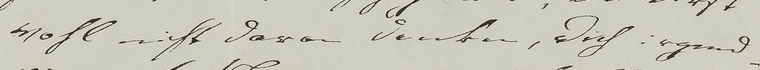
wohl nicht daran denken, Dich irgend-
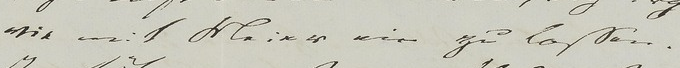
wie mit Meier ein zu lassen.
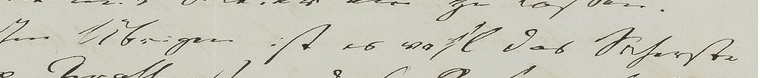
Im Übrigen ist es wohl das Sicherste
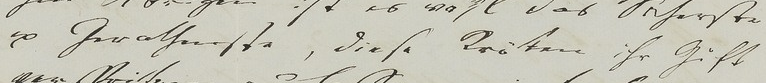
& Gerathenste, diese Kröten ihr Gift
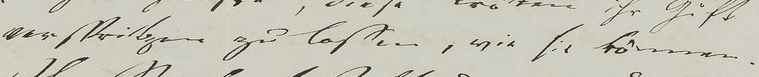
verspritzen zu lassen, wie sie können.
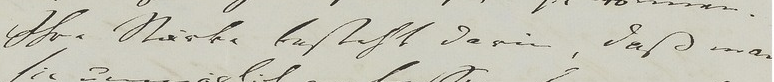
Ihre Stärke besteht darin, daß man
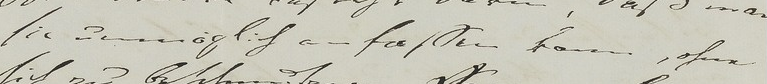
sie unmöglich anfassen kann, ohne
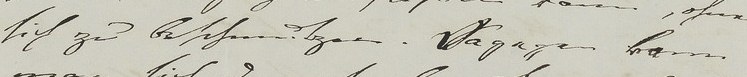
sich zu beschmutzen: Dagegen kann
